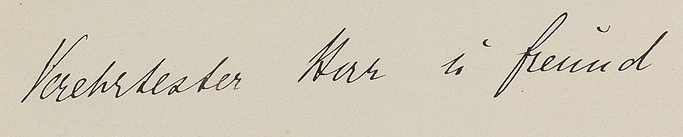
Verehrtester Herr u Freund
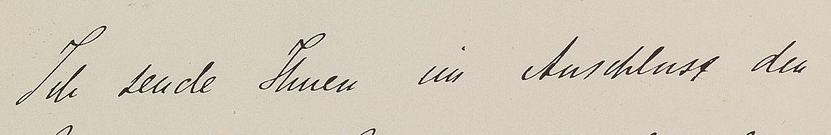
Ich sende Ihnen im Anschluss den
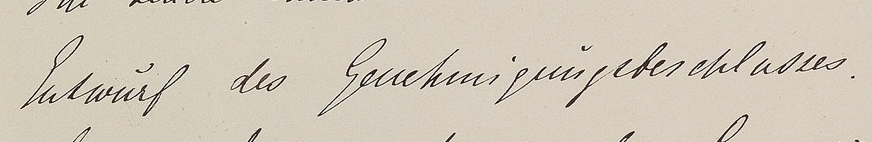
Entwurf des Genehmigungsbeschlusses.
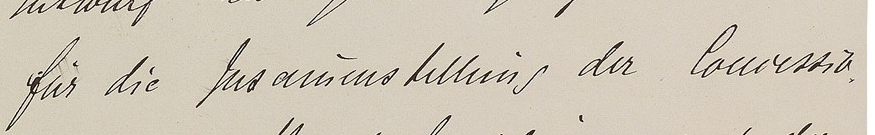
Für die Zusammenstellung der Concessio-
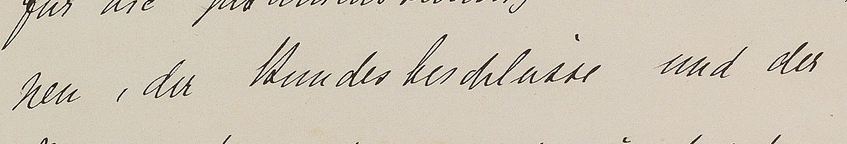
nen, der Bundesbeschlüsse und der
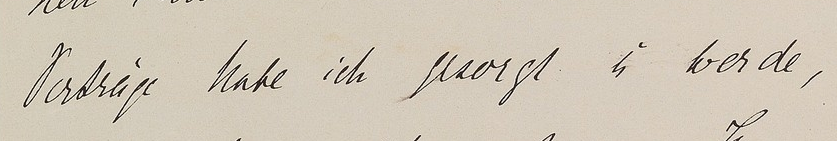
Verträge habe ich gesorgt u werde,
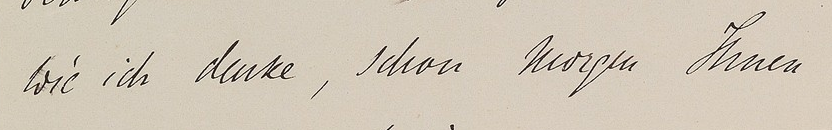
wie ich denke, schon morgen Ihnen
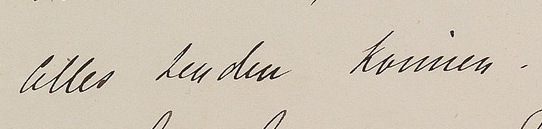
alles senden können.
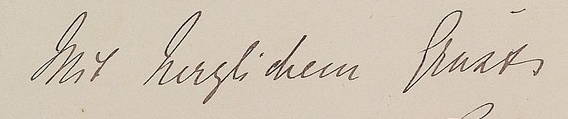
Mit herzlichem Grusse
